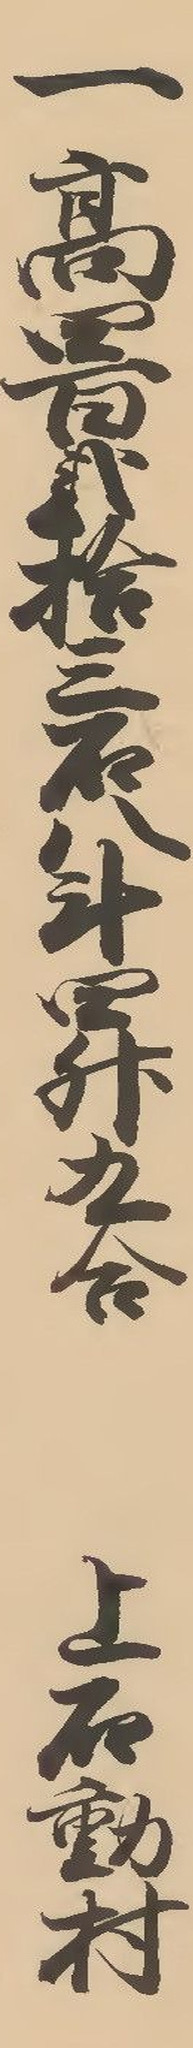一髙四百弐拾三石八斗四升九合上石動村
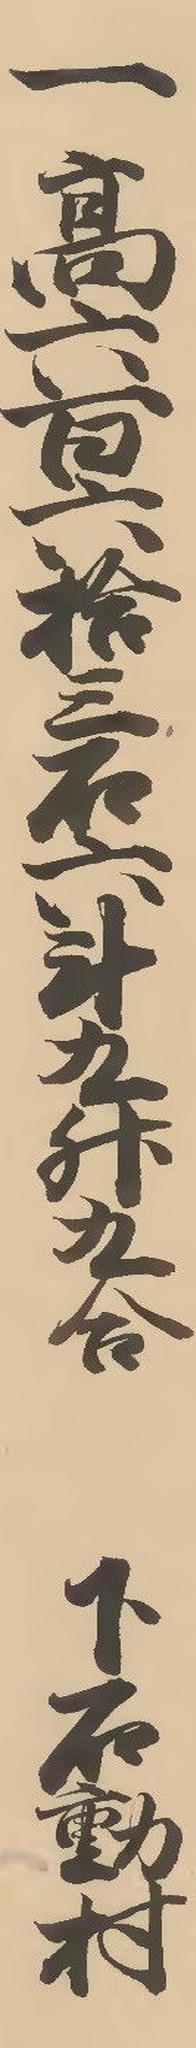一髙六百六拾三石六斗九升九合下石動村
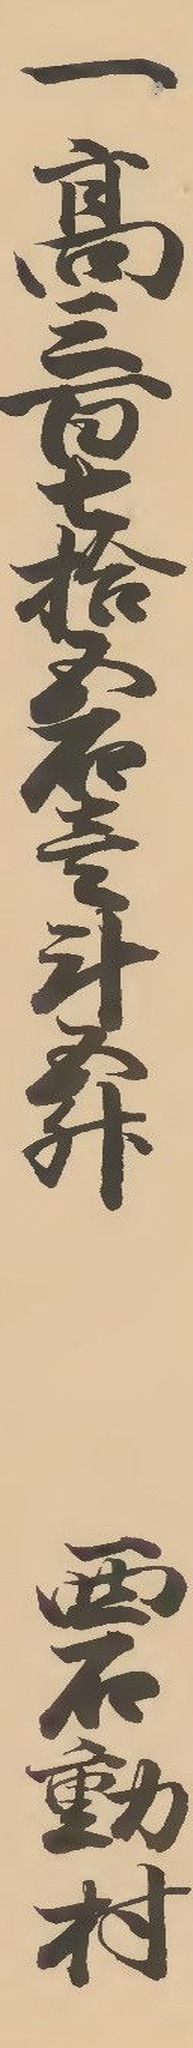一髙三百七拾五石壱斗五升西石動村
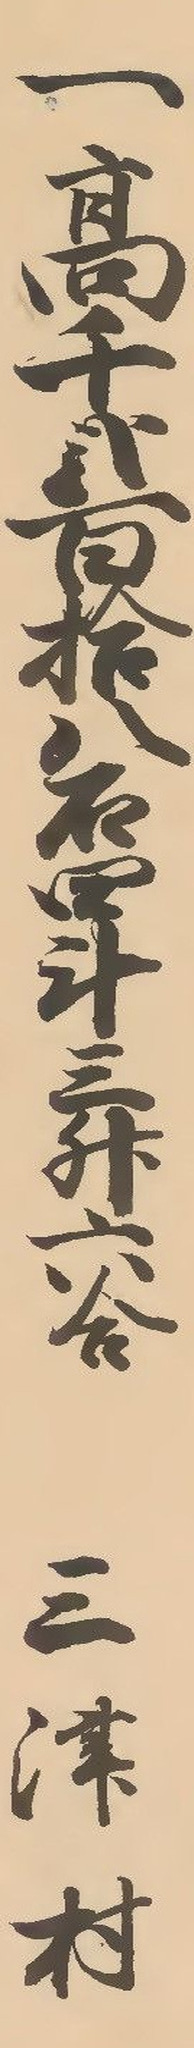一髙千弐百拾八石四斗三升六合三津村
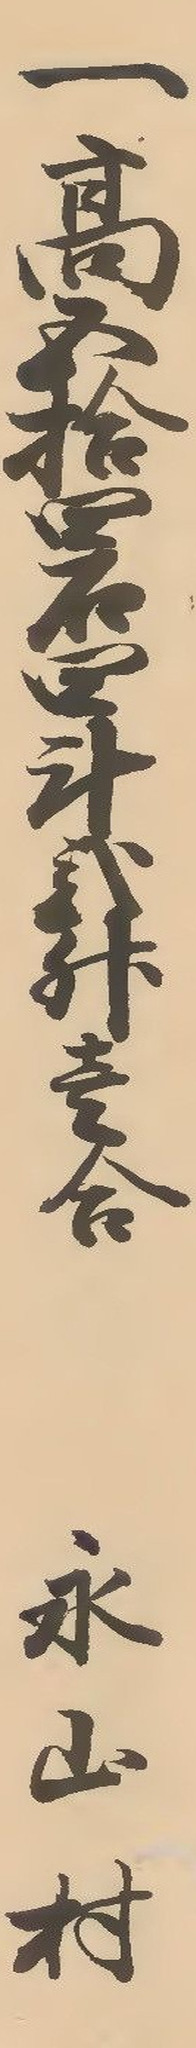一髙五拾四石四斗弐升壱合永山村
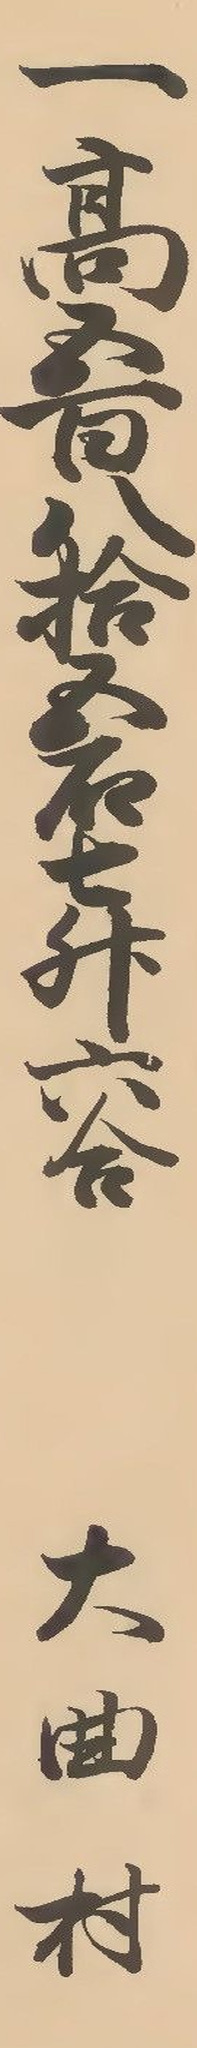一高五百八拾五石七升六合大曲村
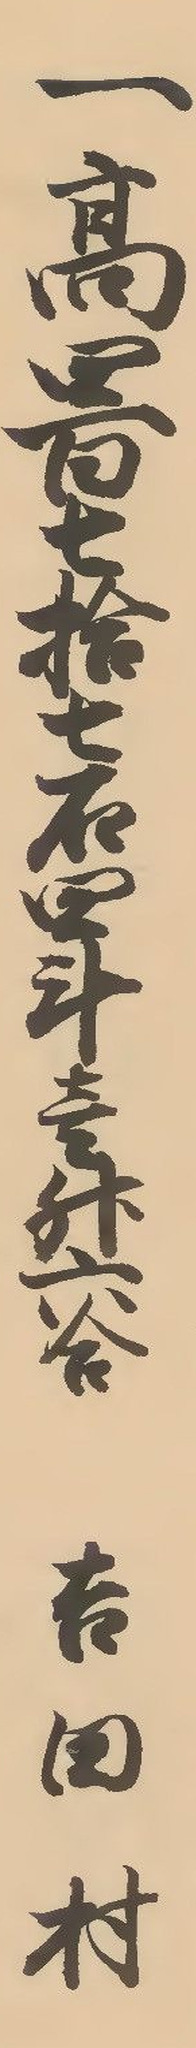一高四百七拾七石四斗壱升六合吉田村

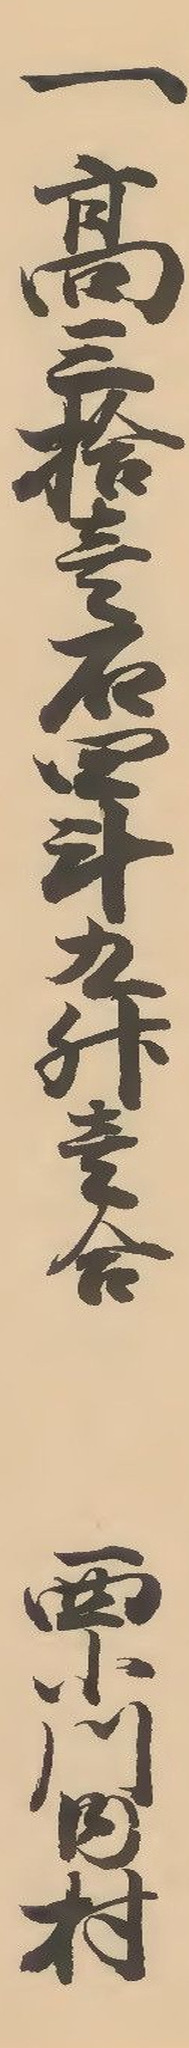一髙三拾壱石四斗九升壱合西小川内村
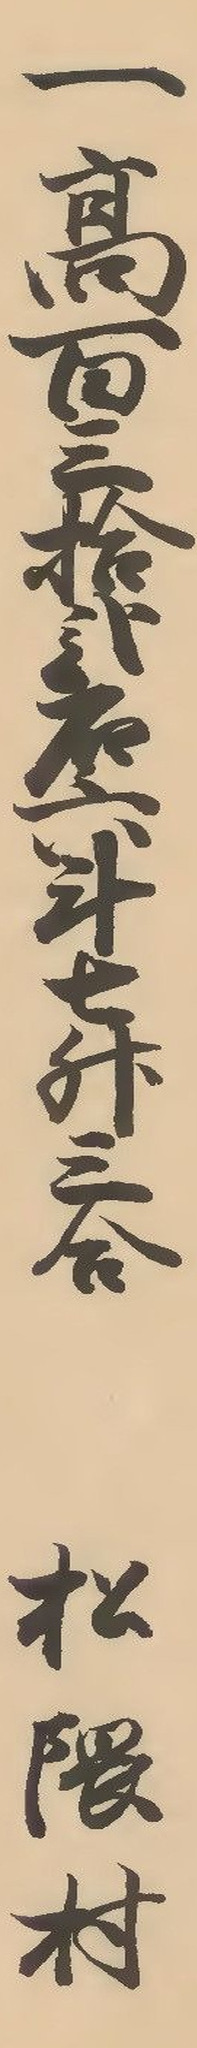一髙百三拾弐石六斗七升三合松隈村
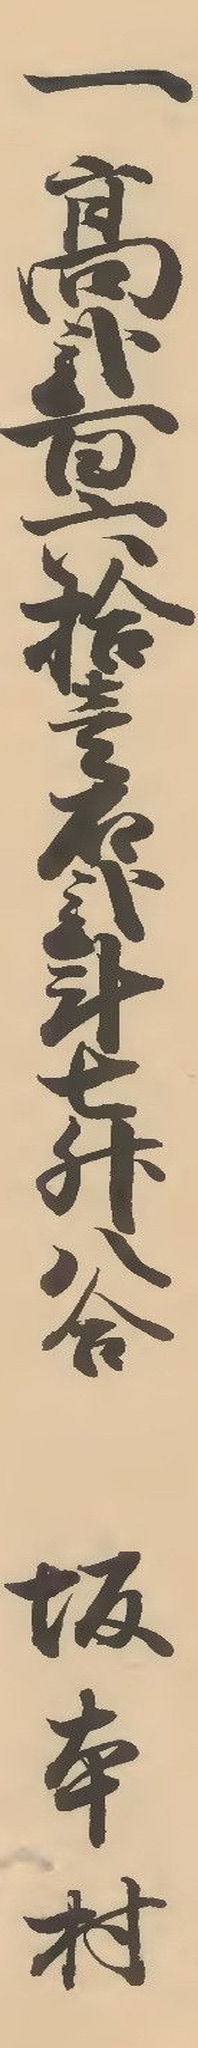一髙弐百六拾壱石弐斗七升八合坂本村
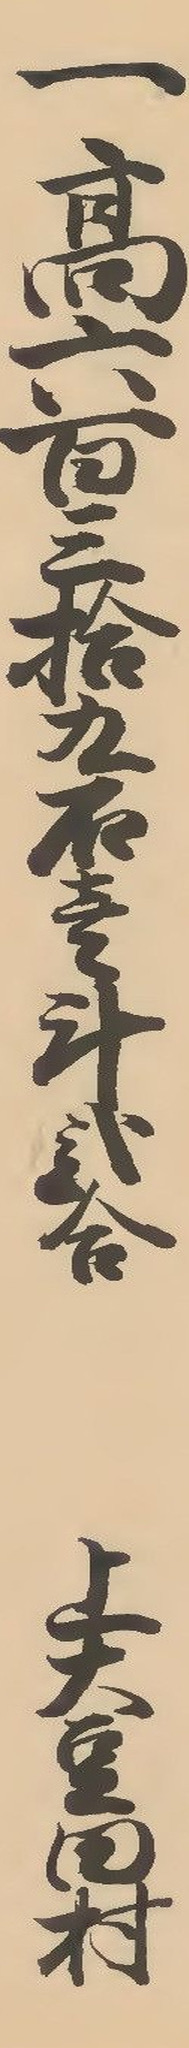一髙六百三拾九石壱斗弐合上大豆田村
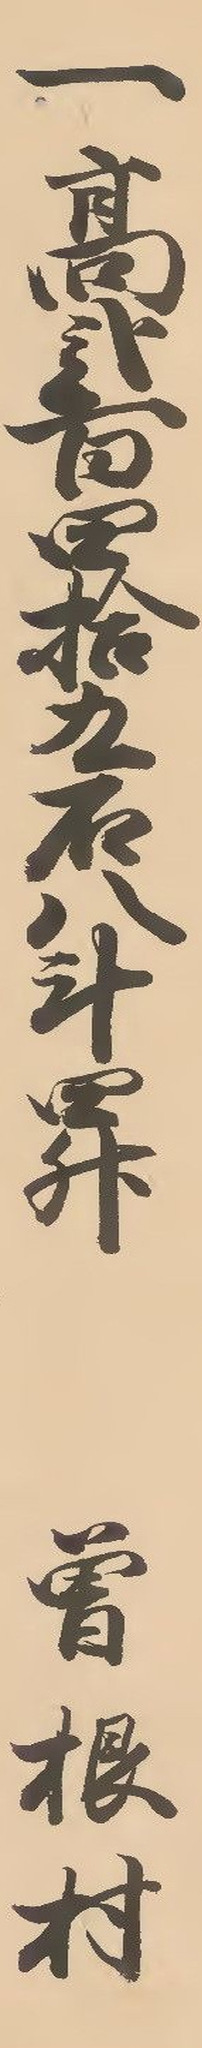一髙弐百四拾九石八斗四升曽根村
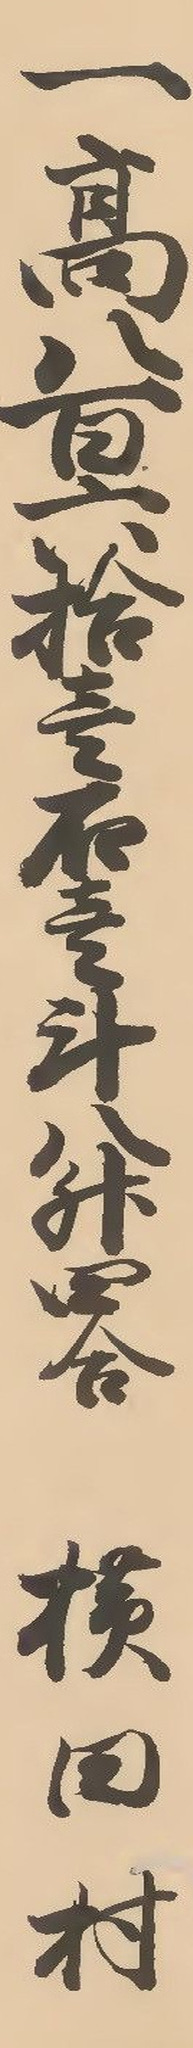一髙八百六拾壱石壱斗八升四合横田村
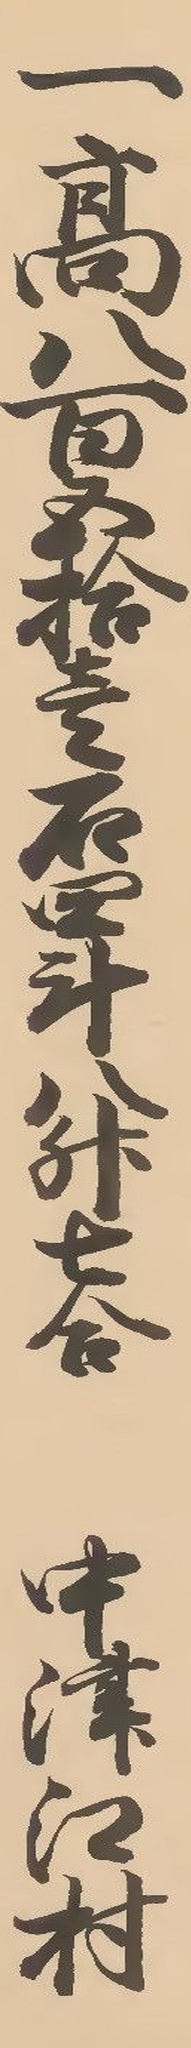一髙八百五拾壱石四斗八升七合中津江村
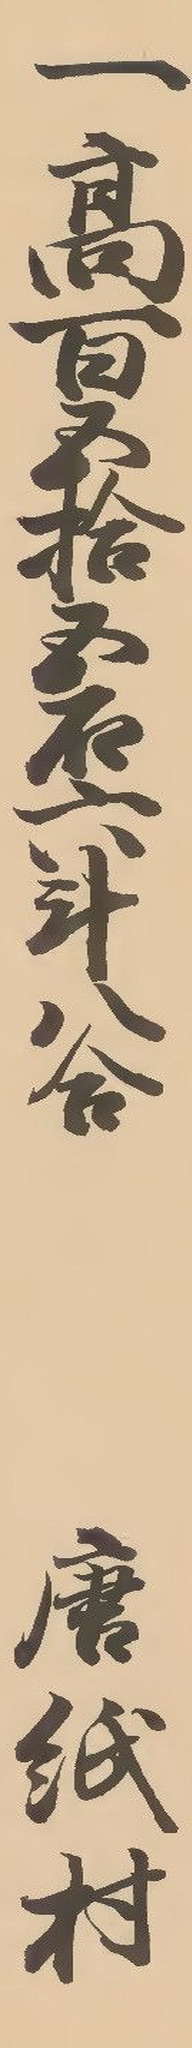一髙百五拾五石六斗八合唐紙村

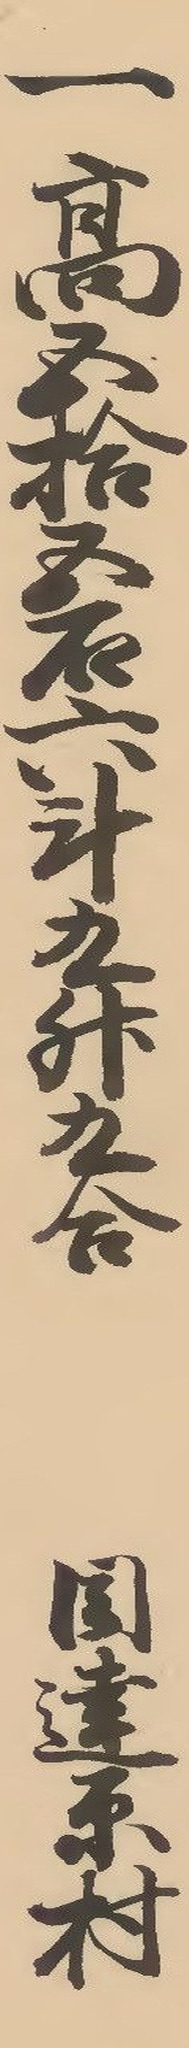一髙五拾五石六斗九升九合目達原村
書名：肥前国郷帳
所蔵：国立公文書館 National Archives of Japan
